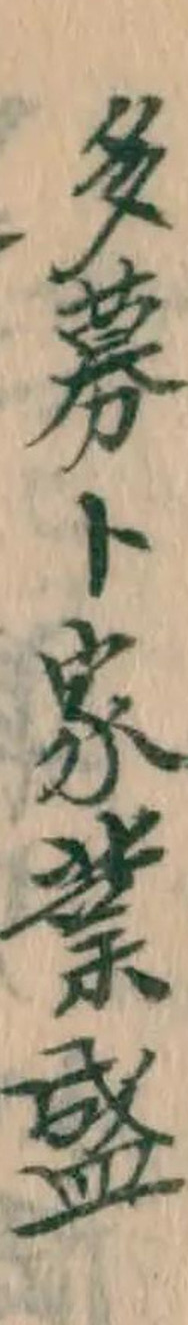多寡卜家業盛
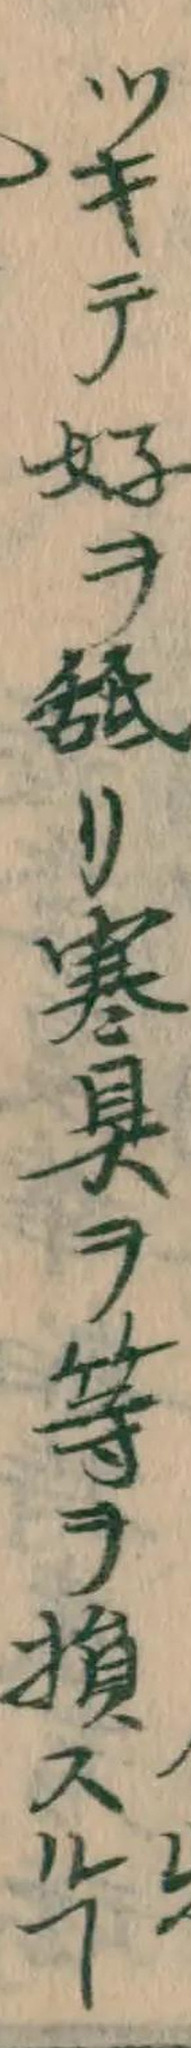ツキテ好ヲ舐リ寒臭ヲ等ヲ損スルコト
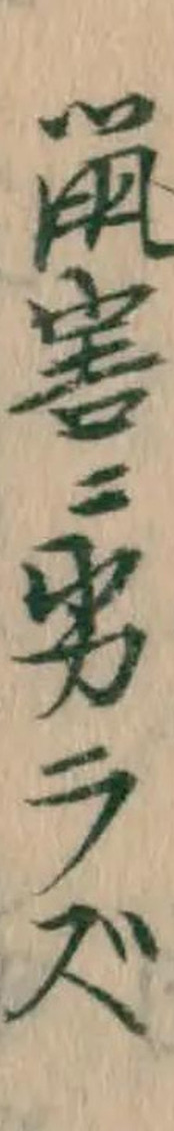鼡害ニ劣ラズ
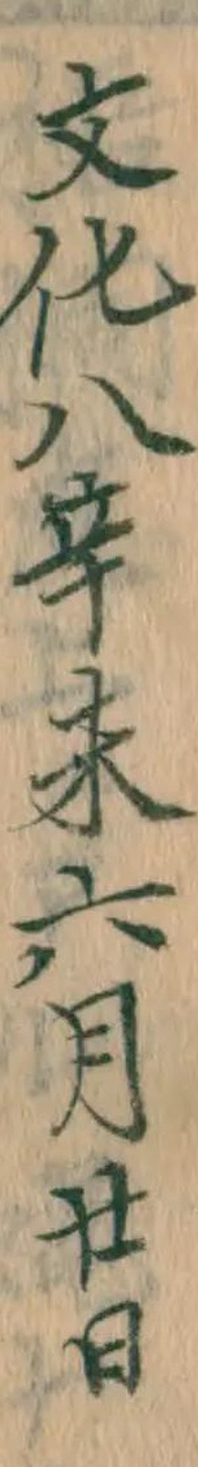文化八辛未六月廿日
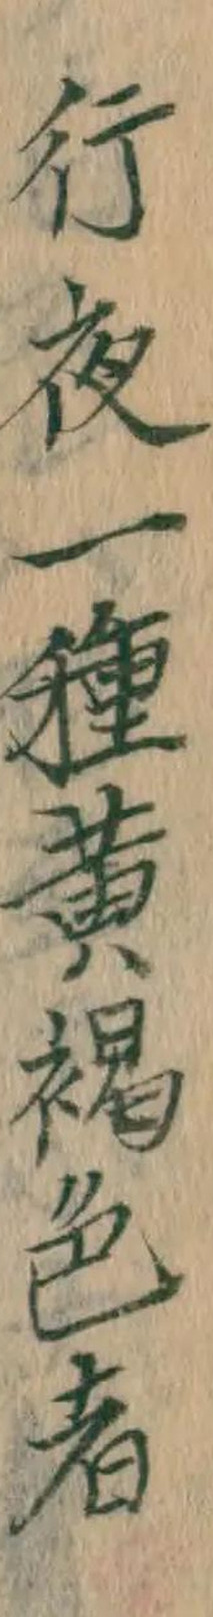行夜一種黄褐色者
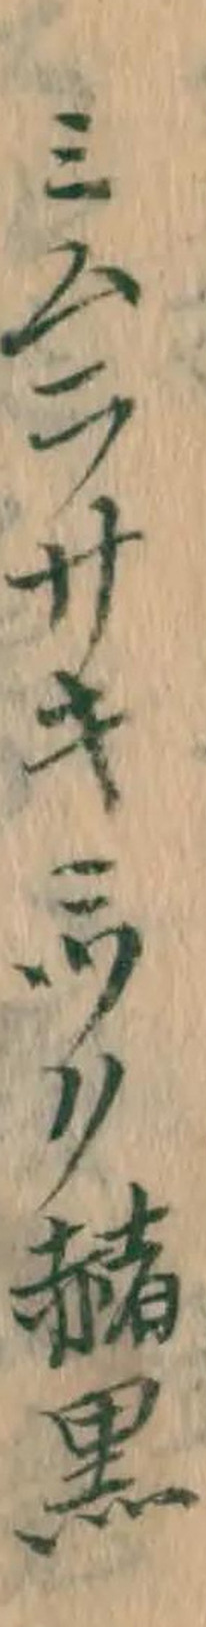ミムラサキニツク赭黒
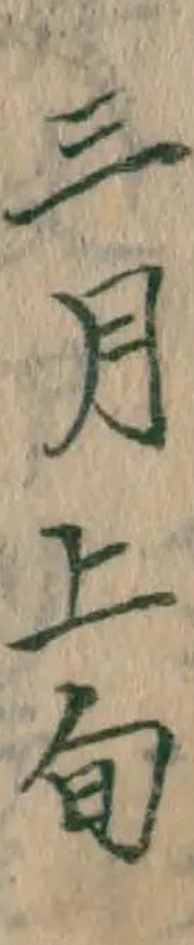三月上旬
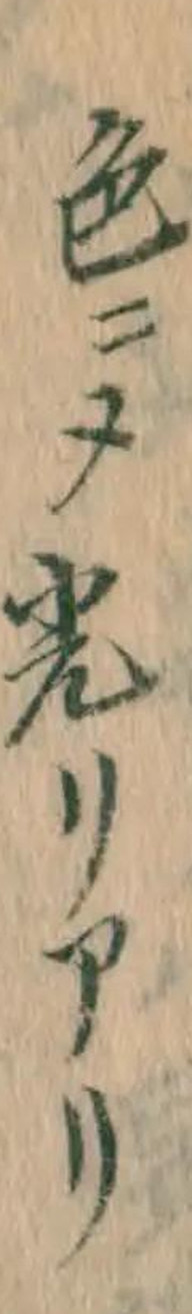色ニシテ光リアリ

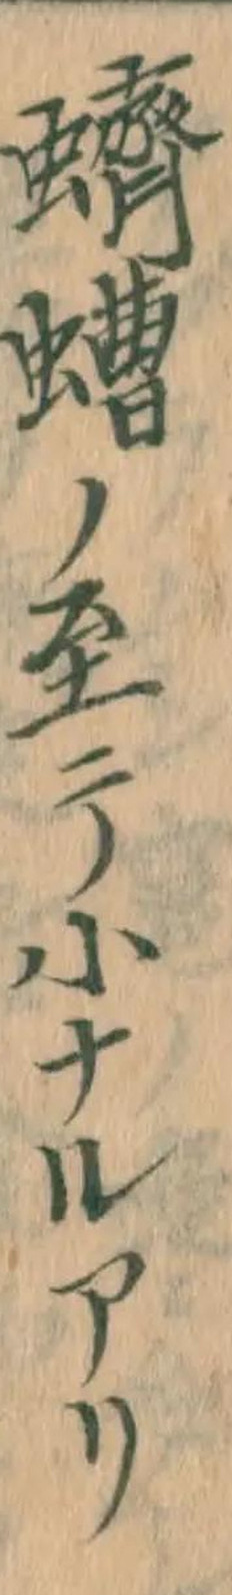蠐螬ノ至テ小ナルアリ
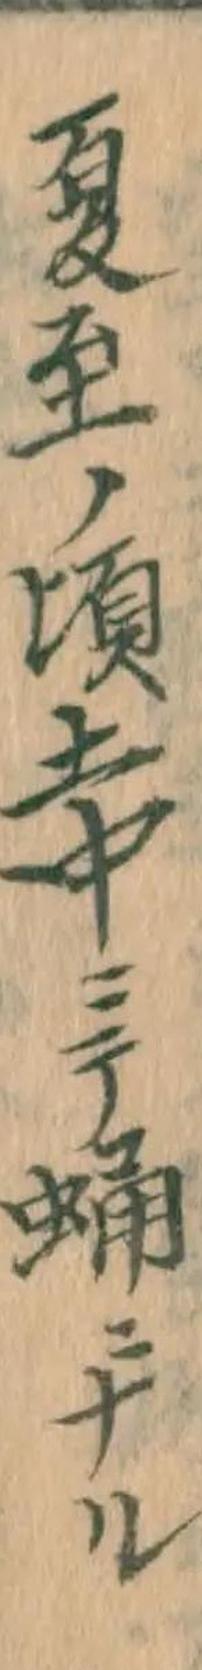夏至ノ頃土中ニテ蛹ニナル
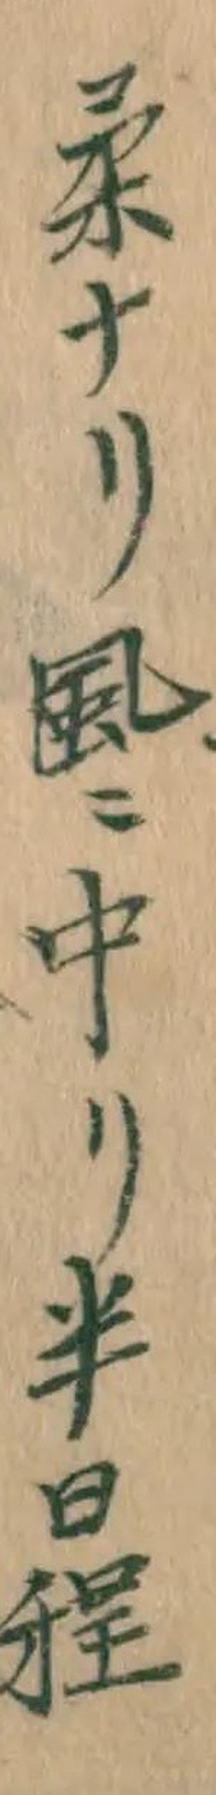柔ナリ風ニ中リ半日程
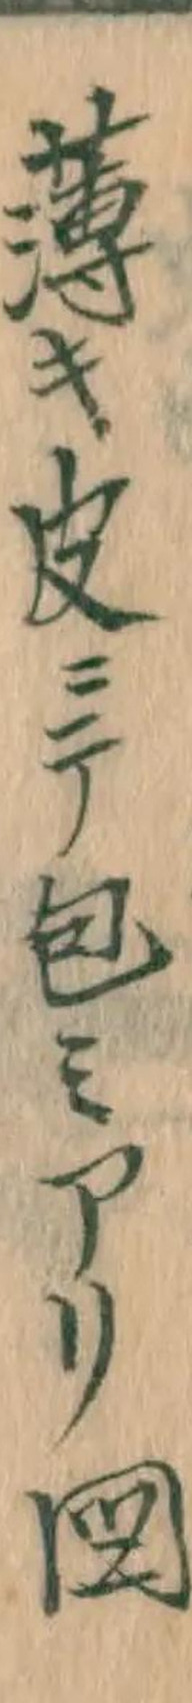薄キ皮ニテ包ミアリ図
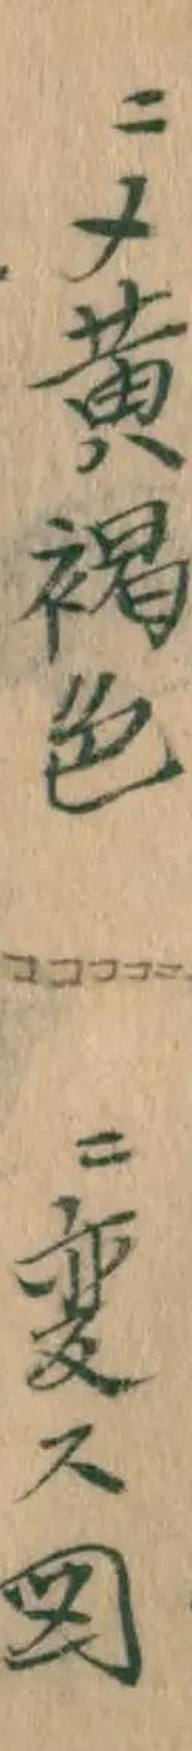ニシテ黄褐色ニ変ス図
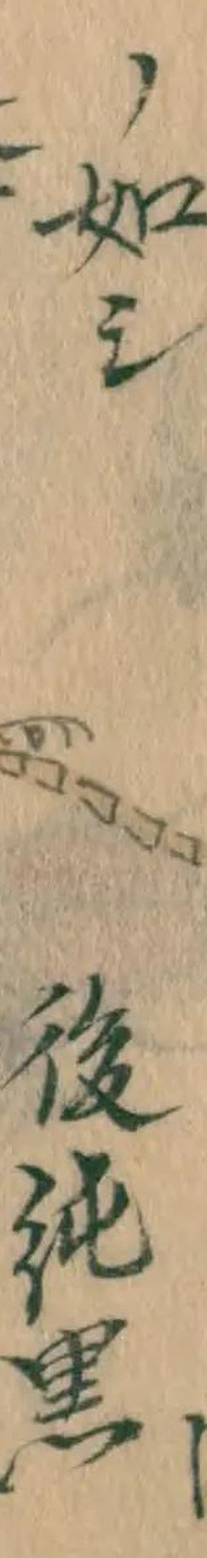ノ如シ後純黒
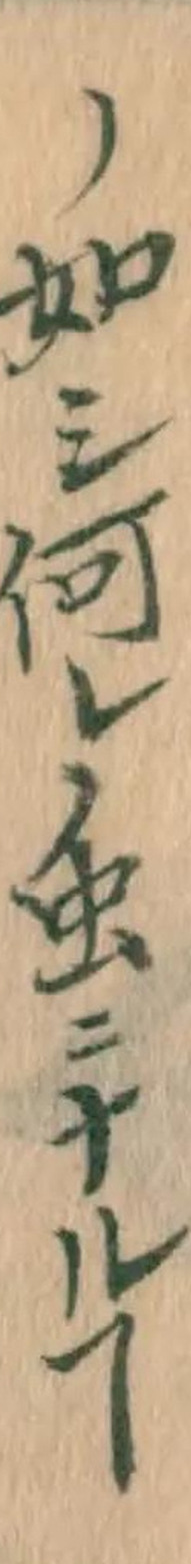ノ如シ何レノ虫ナルコト
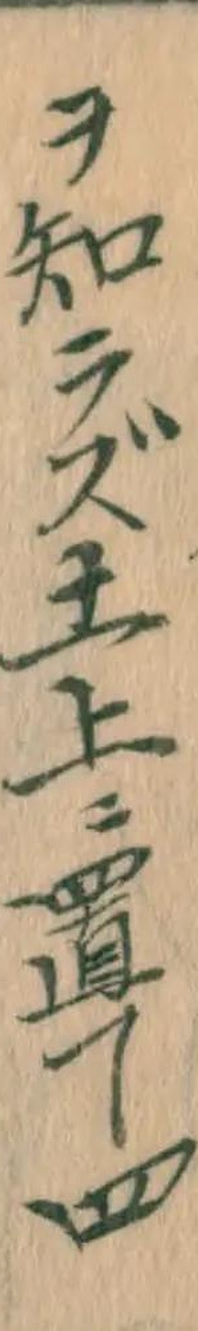ヲ知ラズ土上ニ置コト四
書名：千蟲譜 3巻. [1]
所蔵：国立国会図書館 National Diet Library, JAPAN
